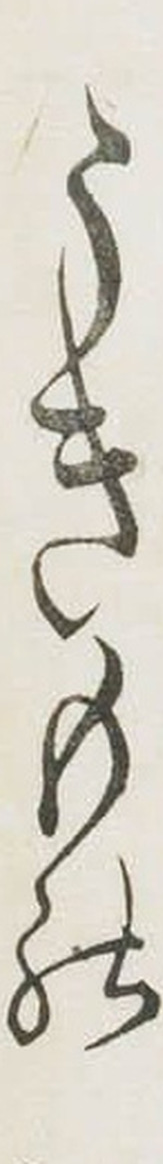うきもの
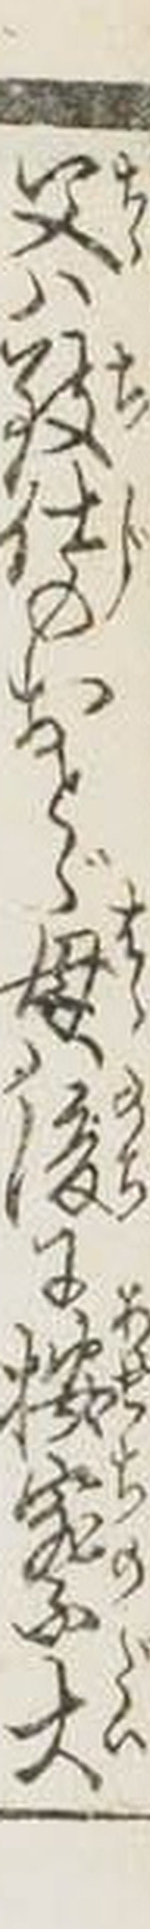父は致仕のおとゞ母は後に按察大
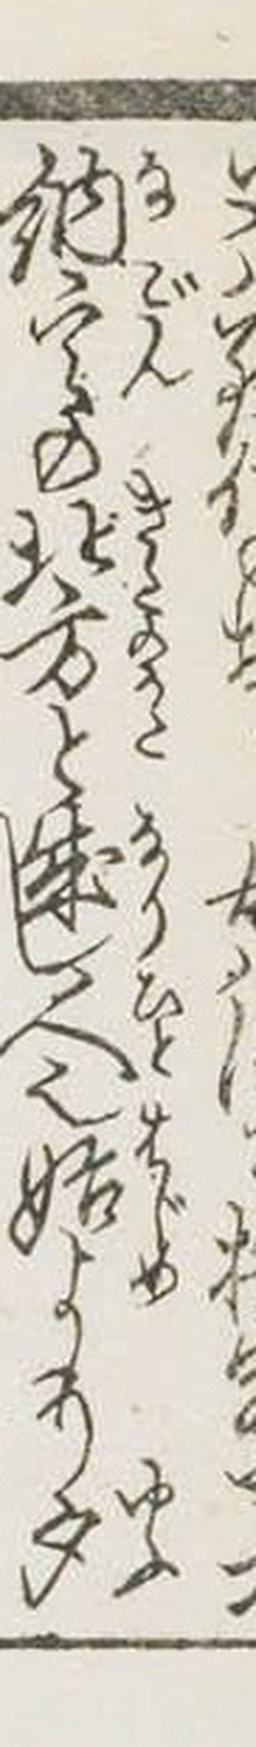納言の北方と成し人也始より夕
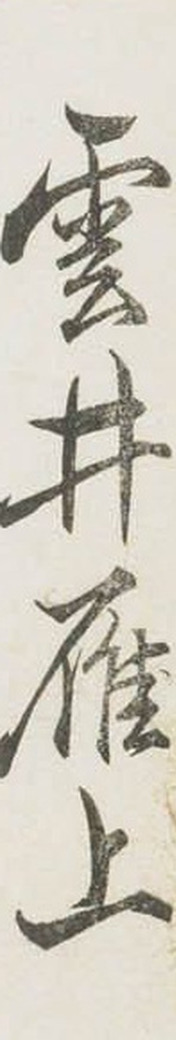雲井雁上
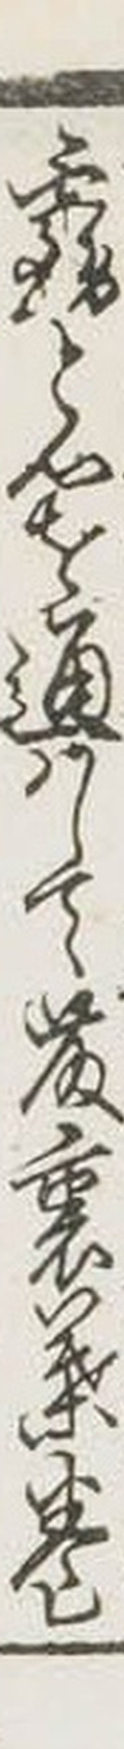霧と心を通はして藤裏葉巻
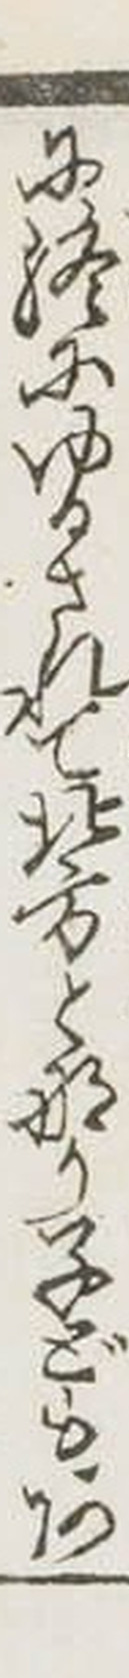に終にゆるされて北方となり子どもあ
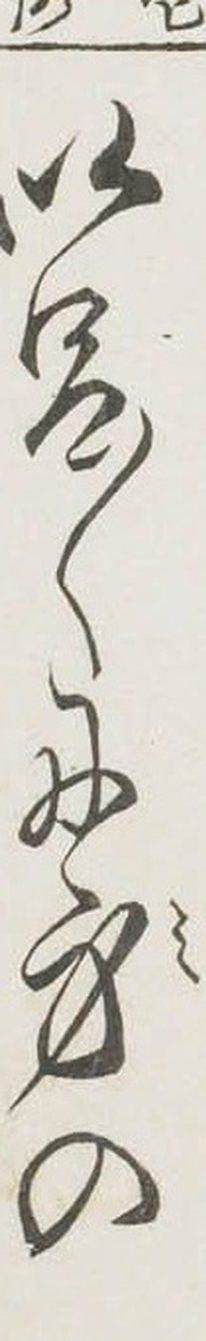いろ〳〵に身の
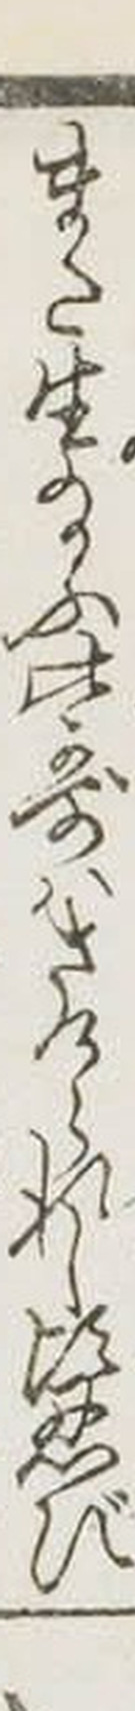また生給ふ此哥はさけられし頃忍び
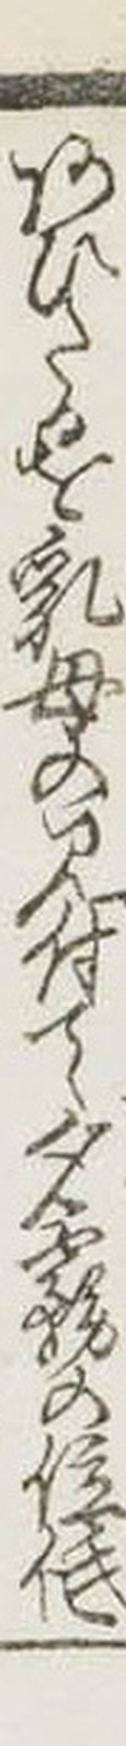あひたるを乳母の見付て夕霧の位低
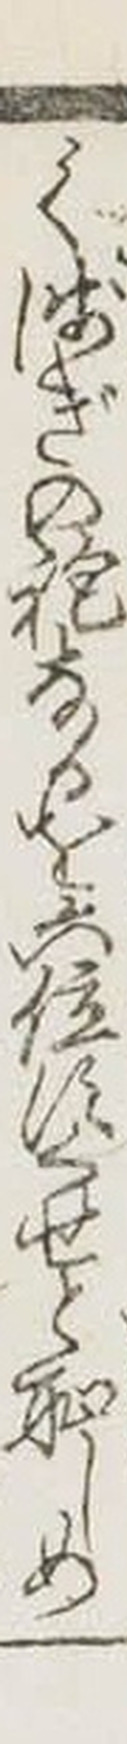く浅ぎの袍なるを六位すくせと恥しめ
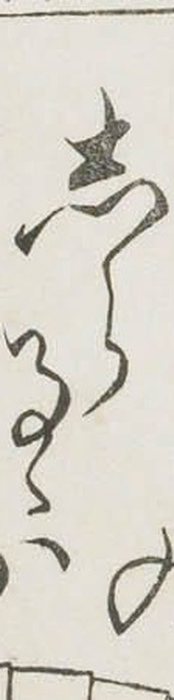しらるゝは
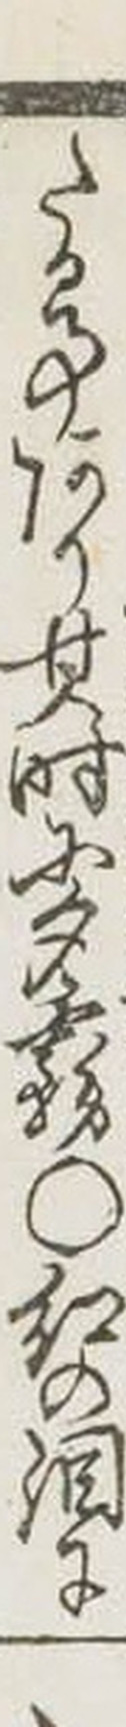たる事あり其時に夕霧○紅の泪に
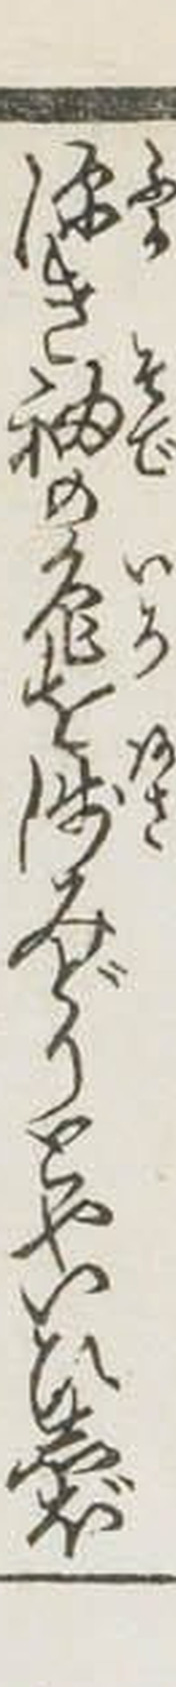深き袖の色を浅みどりとやいひしぼ
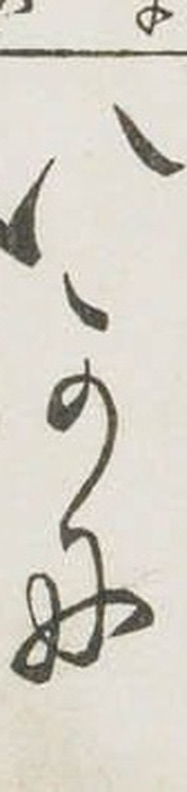いかに
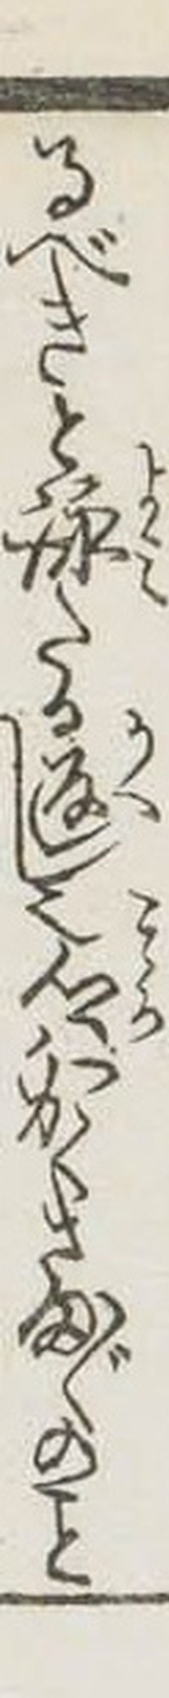るべきと詠たる返し也心はかくさま〴〵のこと
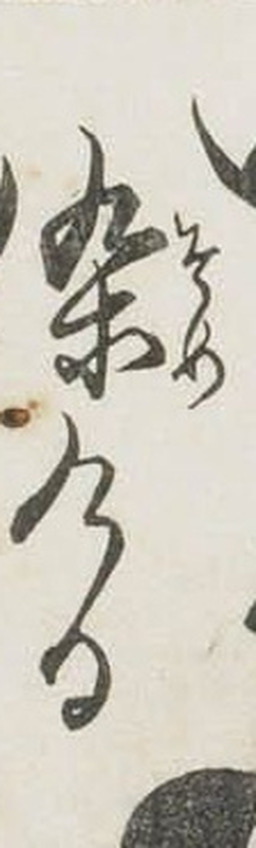染ける
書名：源氏百人一首
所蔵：東京学芸大学教育コンテンツアーカイブ
